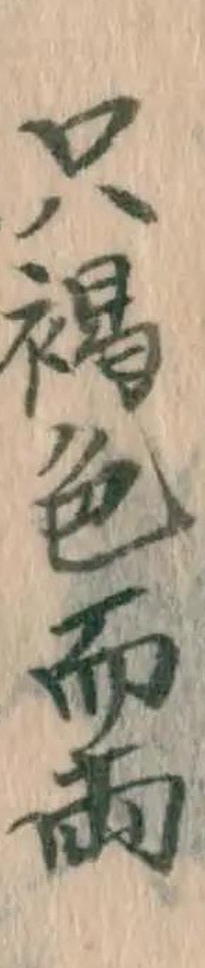只褐色而両
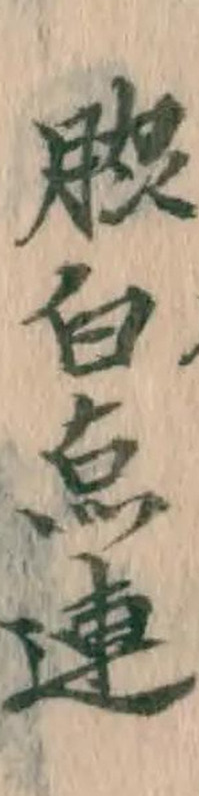脇白点連
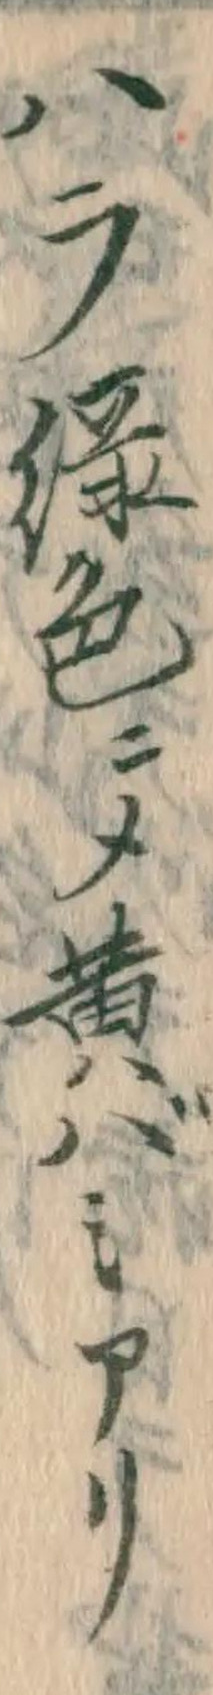ハラ緑色ニシテ黄バミアリ
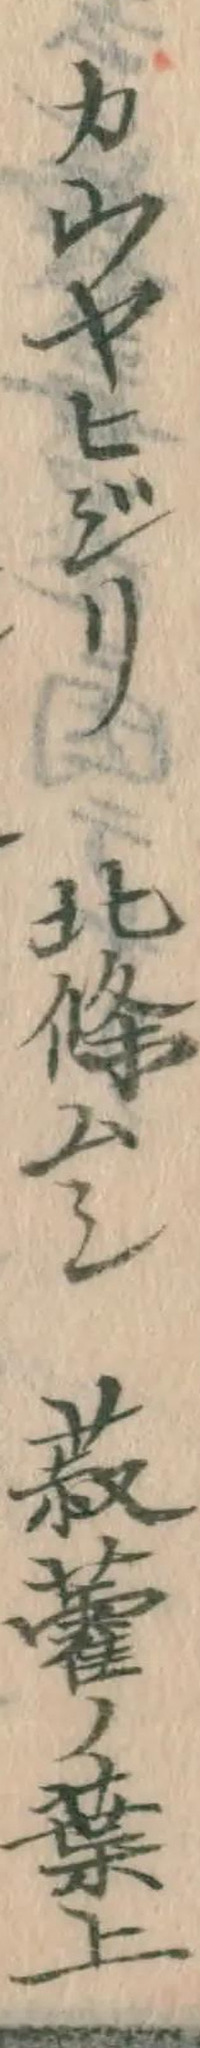カウヤヒジリ北條ムシ菽藿ノ葉上
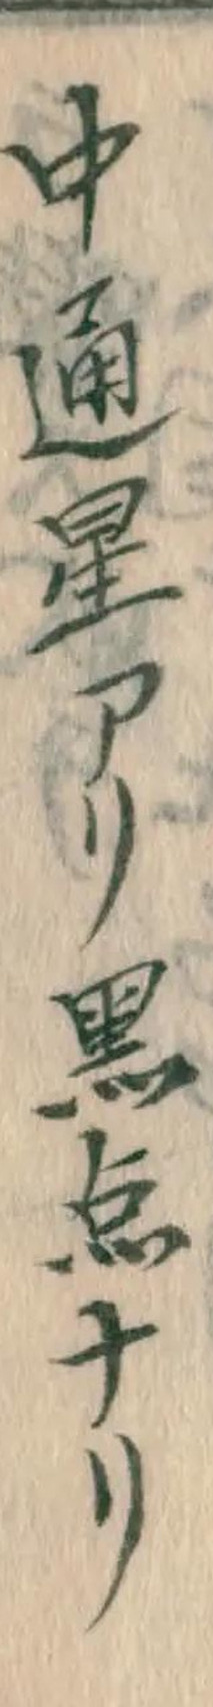中通星アリ黒点ナリ
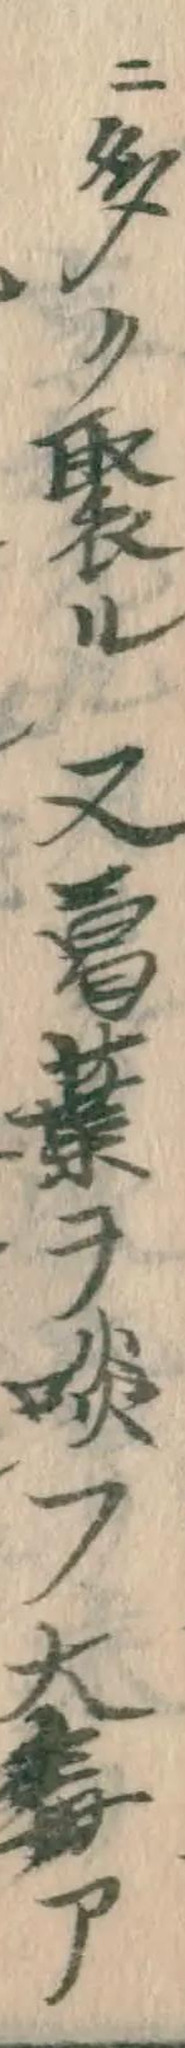ニ多ク聚ル又葛葉ヲ啖フ大毒ア
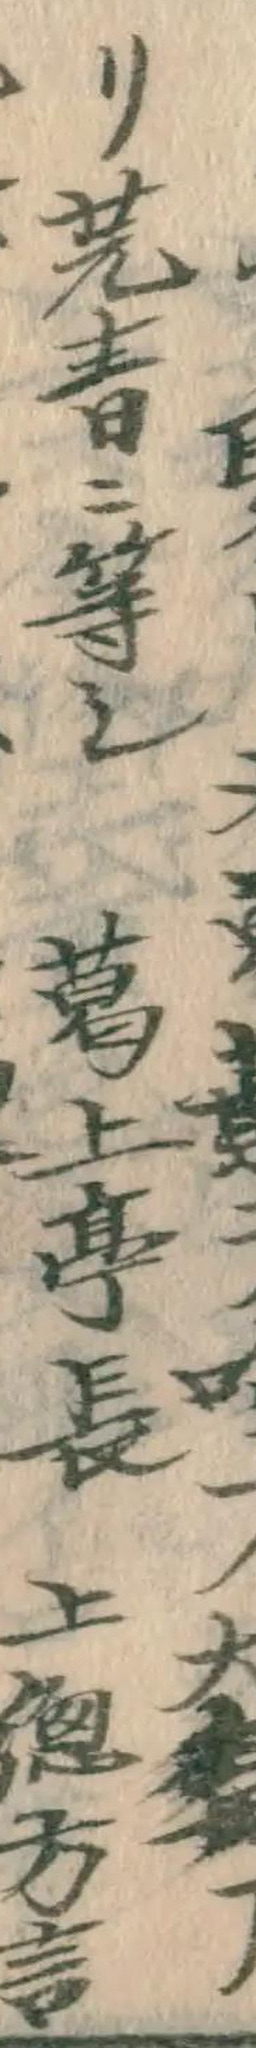リ芫青ニ等シ葛上亭長上總方言
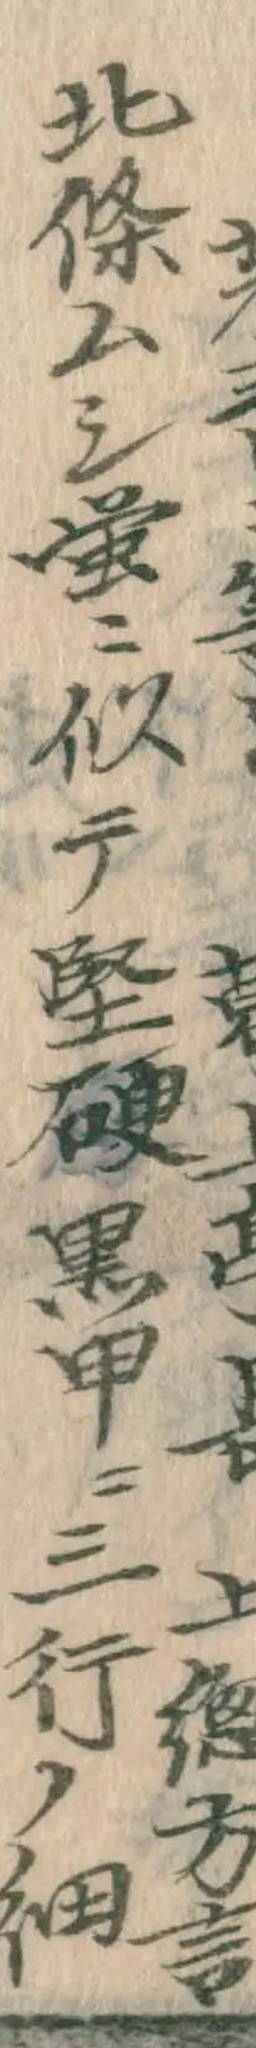北條ムシ蛍ニ似テ堅硬黒甲ニ三行ノ細
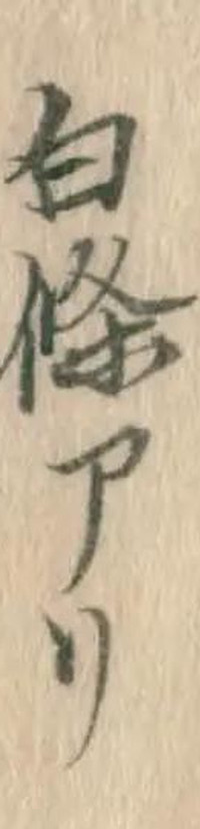白條アリ
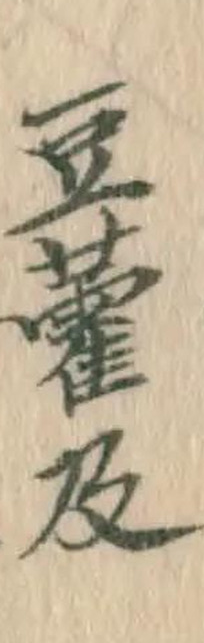豆藿及
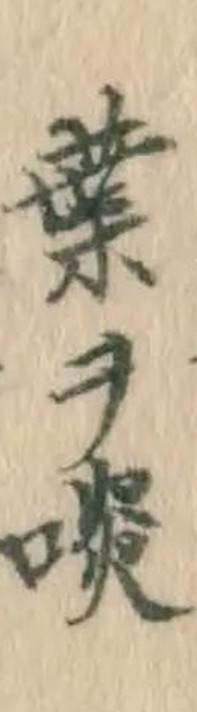葉ヲ啖
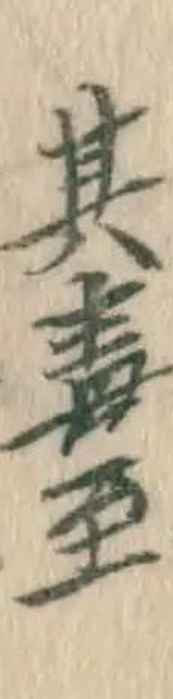其毒至
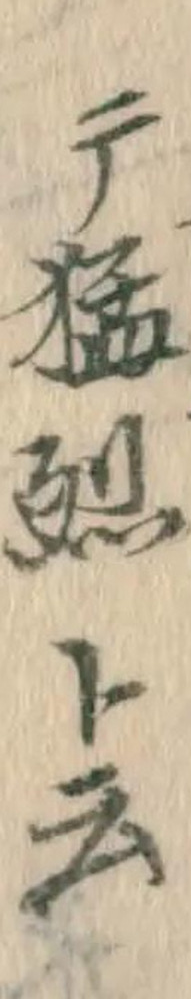テ猛烈ト云
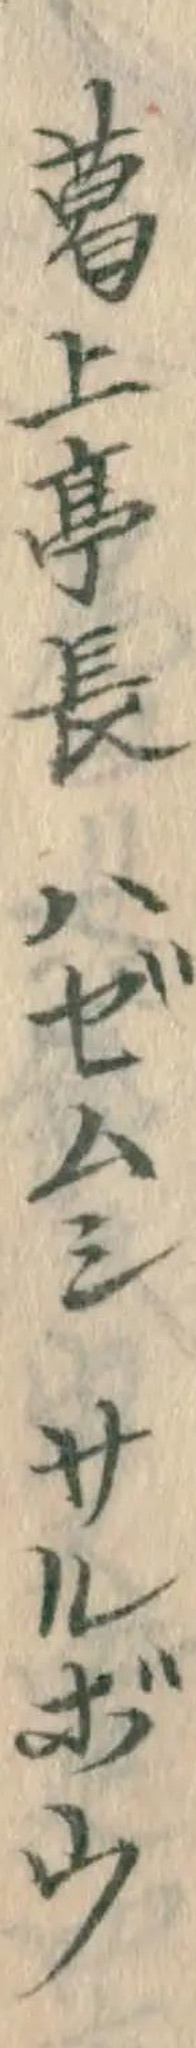葛上亭長ハゼムシサルボウ

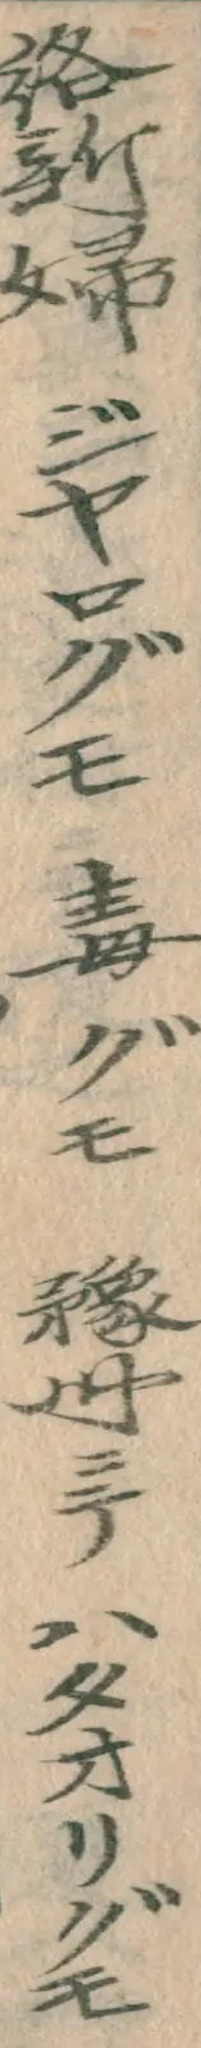絡新婦ジヤログモ毒グモ豫州ニテハタオリグモ
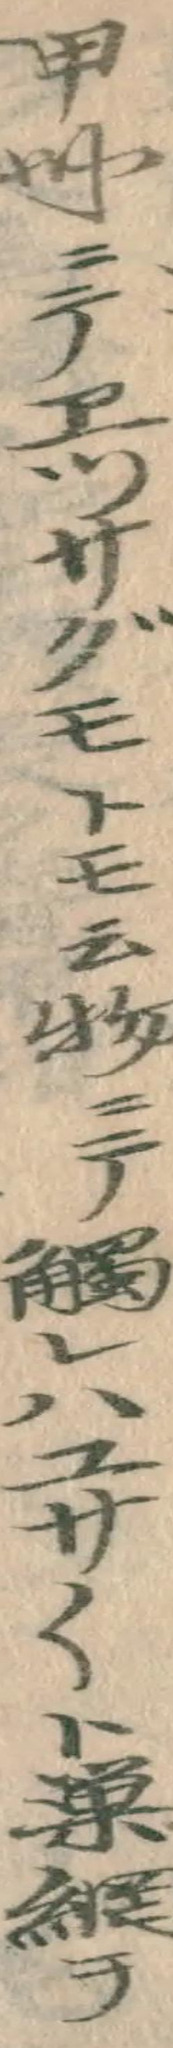甲州ニテヱツサグモトモ云物ニテ觸レハユサ〳〵ト巣網ヲ
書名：千蟲譜 3巻. [2]
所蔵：国立国会図書館 National Diet Library, JAPAN
